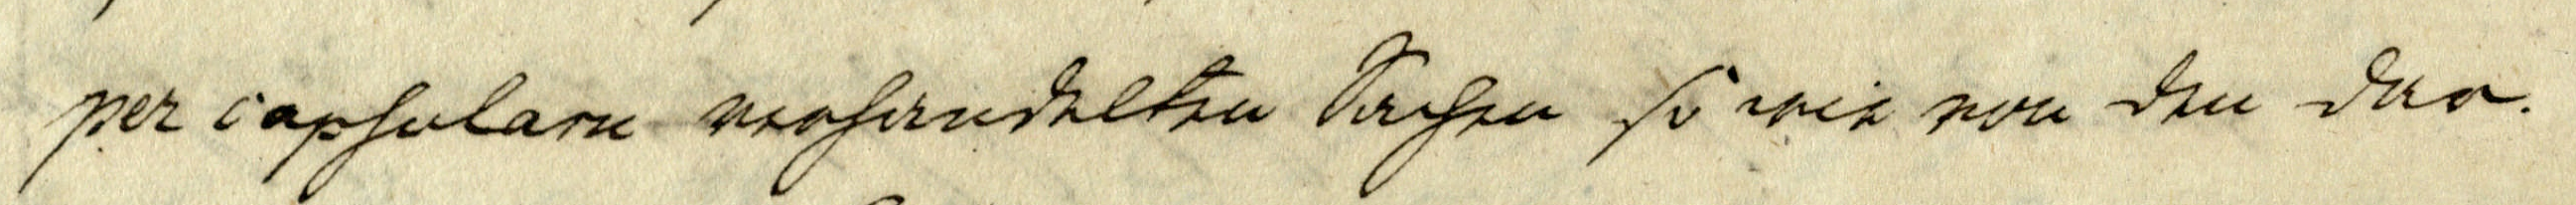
per capsulam verhandelten Sachen so wie von den dar¬
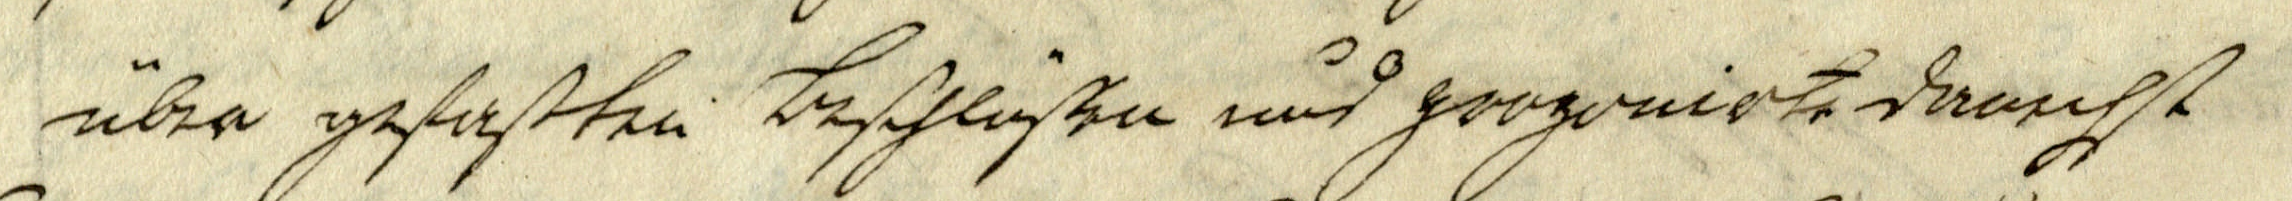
über gefaßten Beschlüssen und proponirte danechst
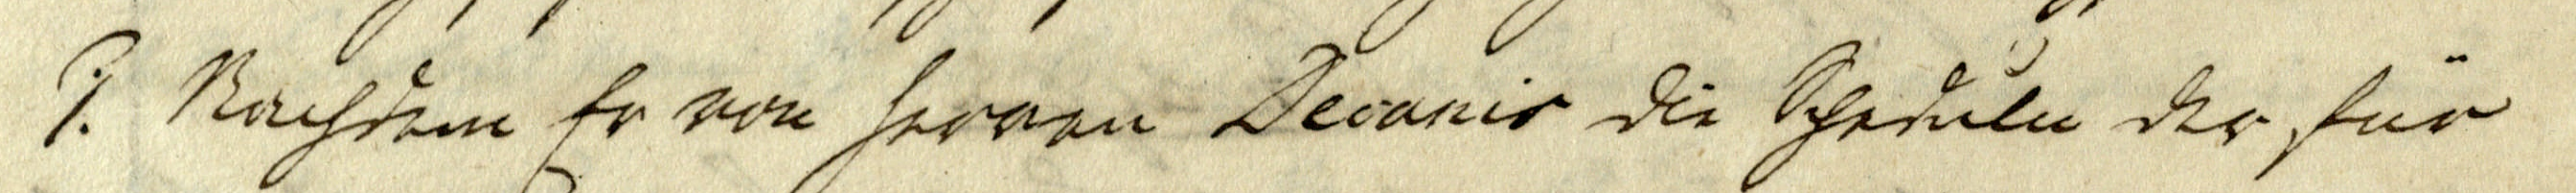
1. Nachdem Er von herren Decanis die Scheduln der für
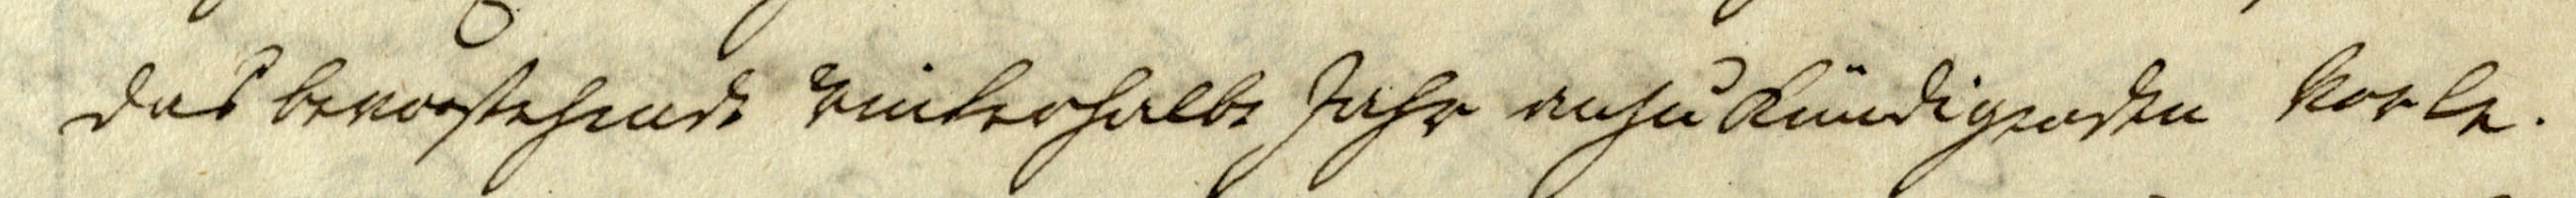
das bevorstehende winterhalbe Jahr anzukündigenden Vorle¬
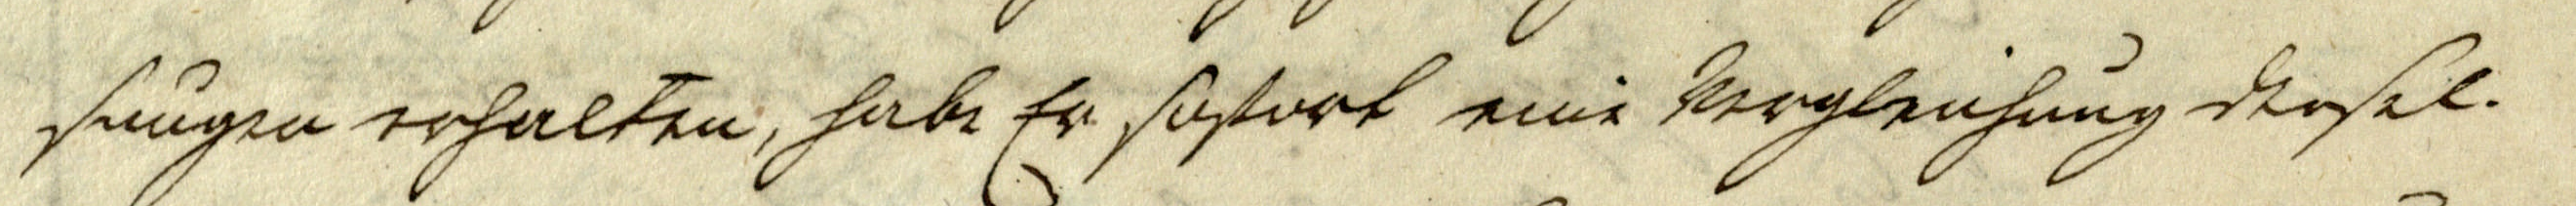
sungen erhalten, habe Er sofort eine Vergleichung dersel¬
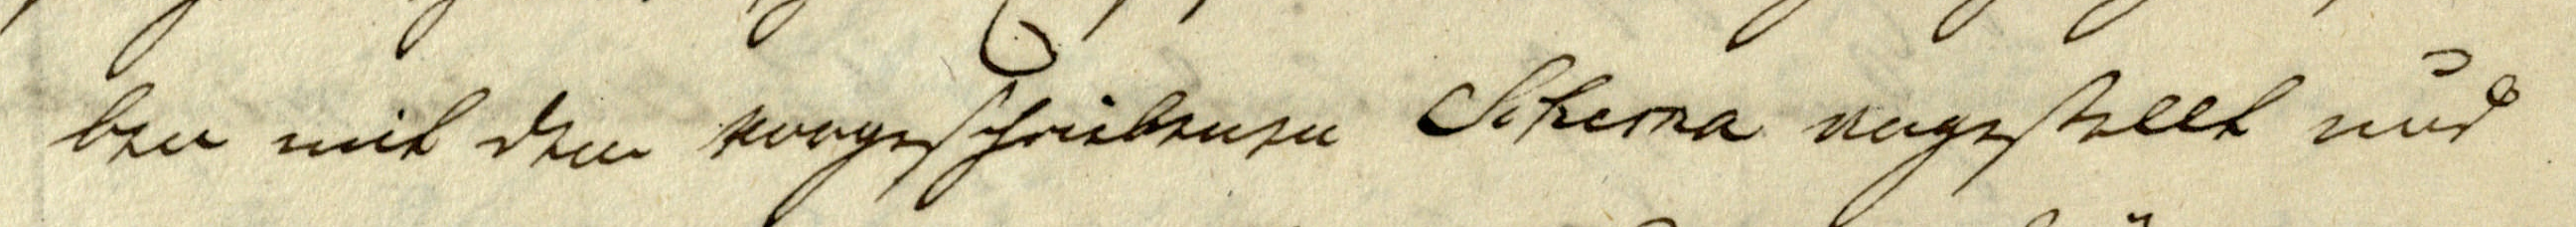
ben mit dem vorgeschriebenen Schema angestellt und
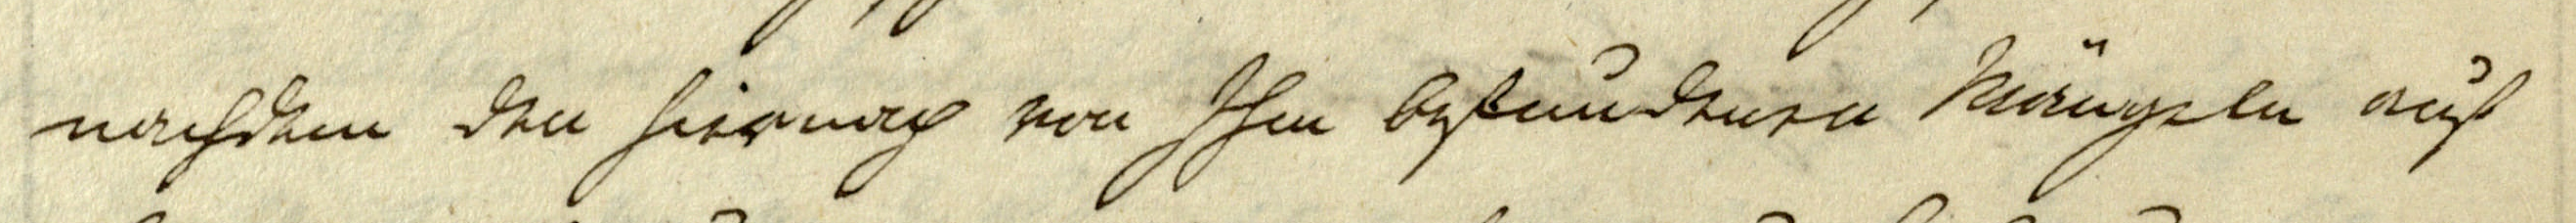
nachdem den hiernach von Ihm befundenen Mängeln auf
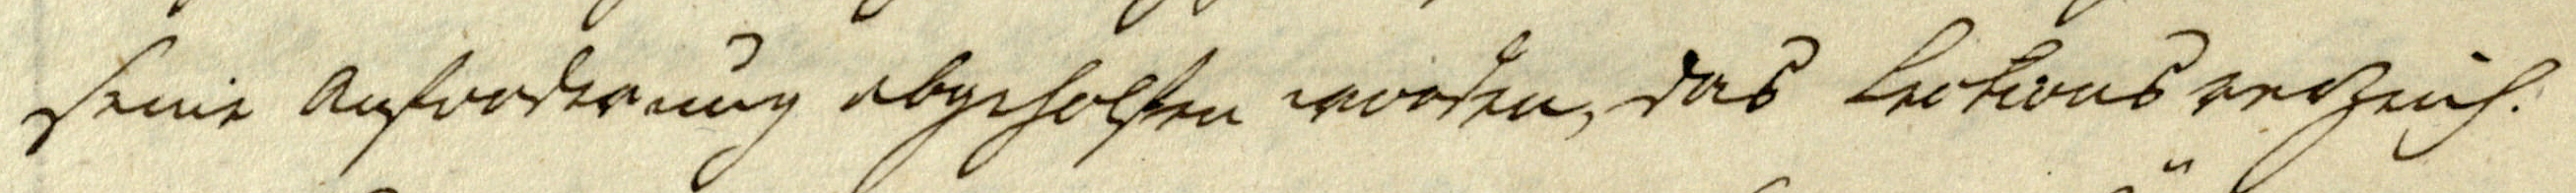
seine Anforderung abgeholfen worden, das Lectionsverzeich¬
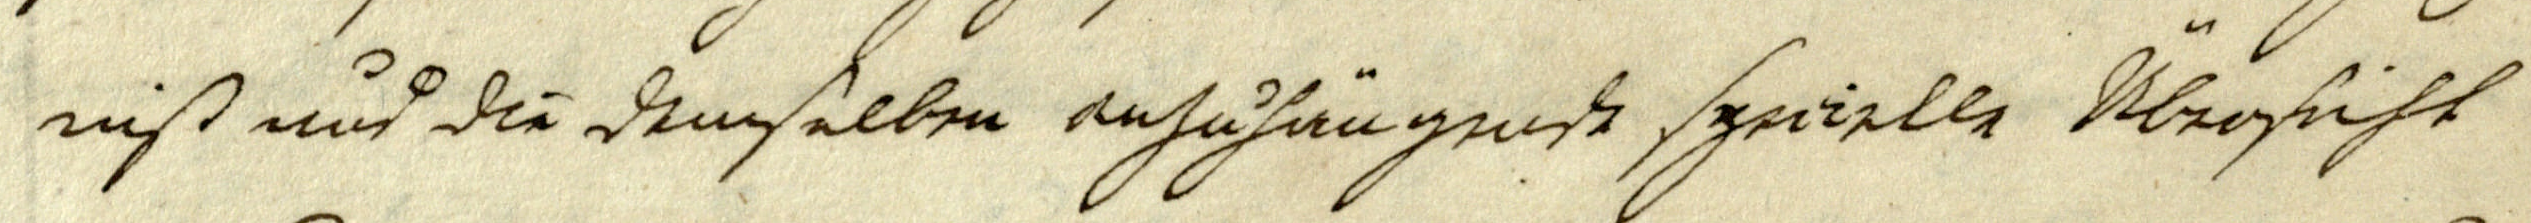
niß und die demselben anzuhängende specielle Übersicht
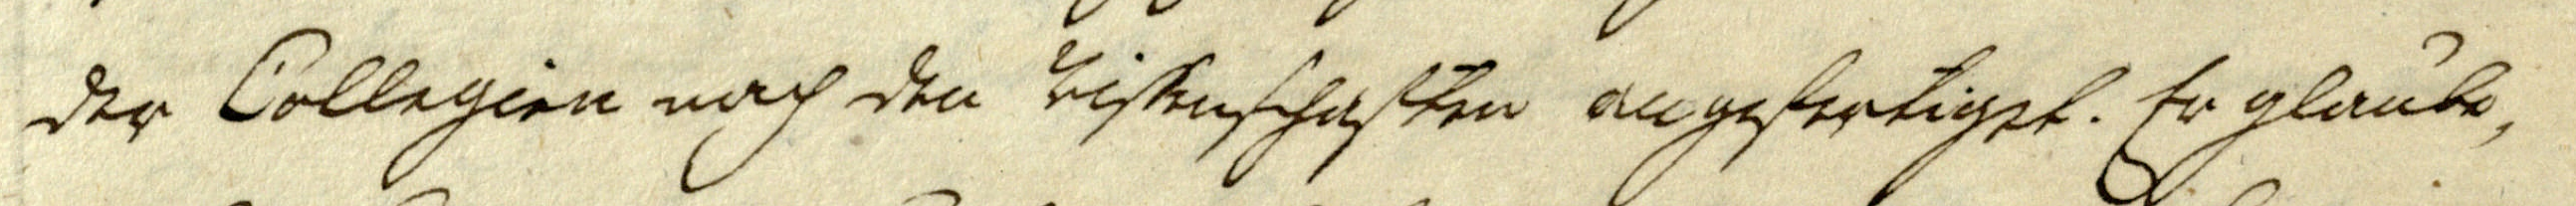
der Collegien nach den Wissenschaften angefertiget. Er glaube,
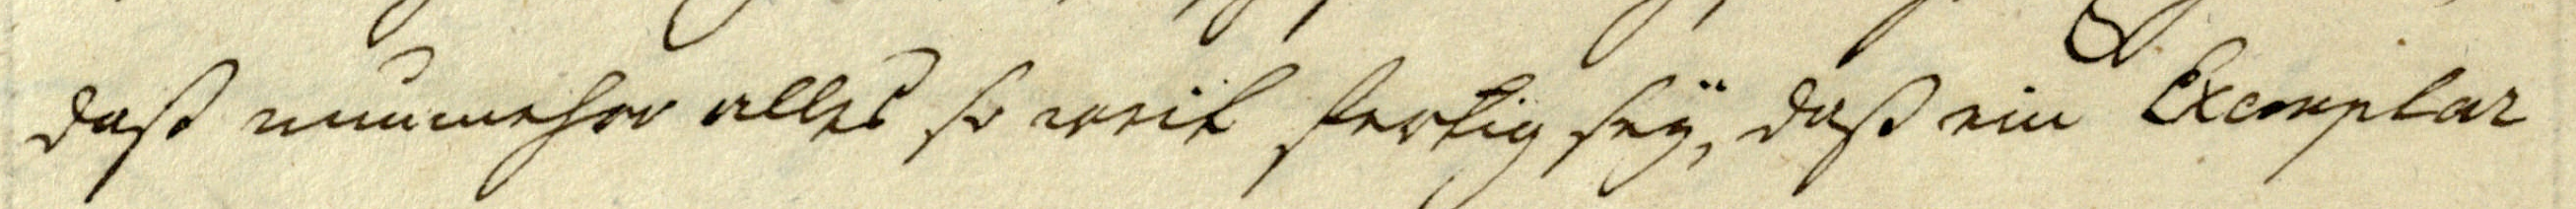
daß nunmehro alles so weit fertig seÿ, daß ein Exemplar
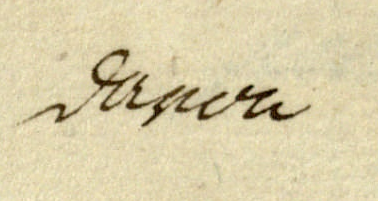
davon
